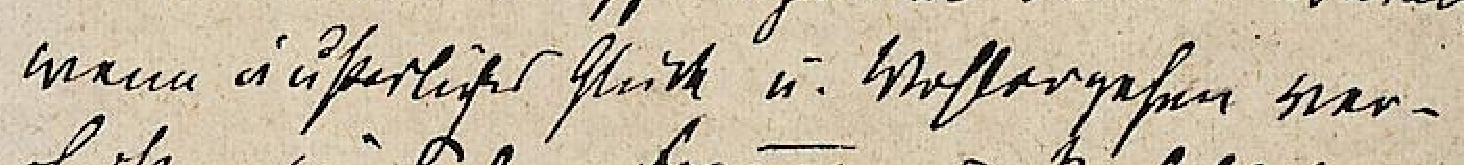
wenn äußerliches Glück u. Wohlergehen ver¬
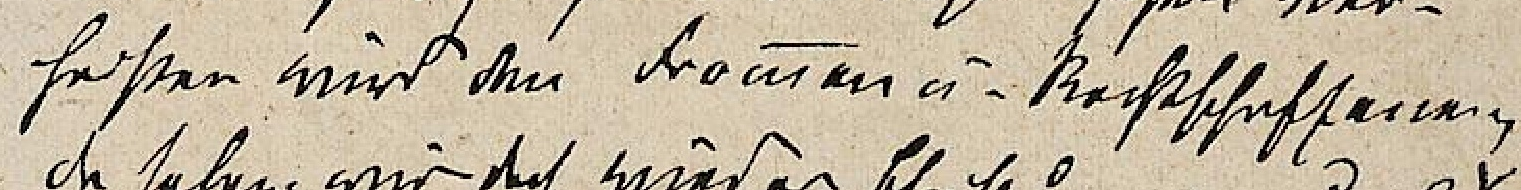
heißen wird dam Fromen u. Rechtschaffenen,
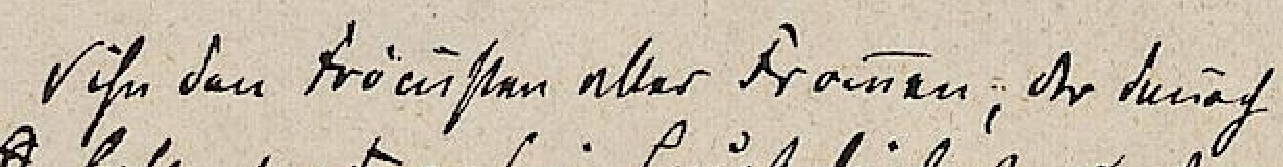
V ihn den Frömsten aller Fromen, der denoch
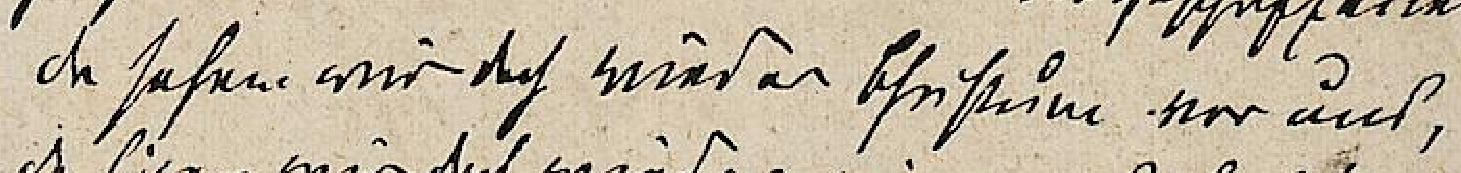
da sehen wir dch wieder Christum vor aus,
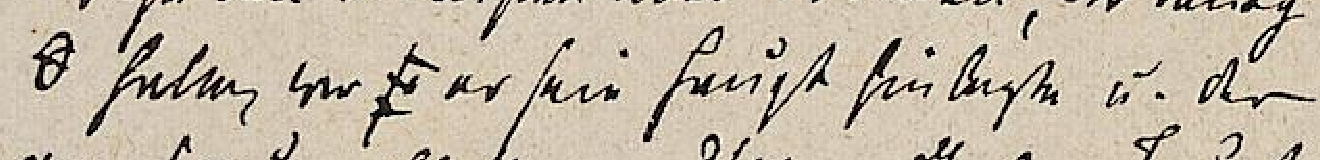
o halten, wo f er seie Herz hinlegte u. der
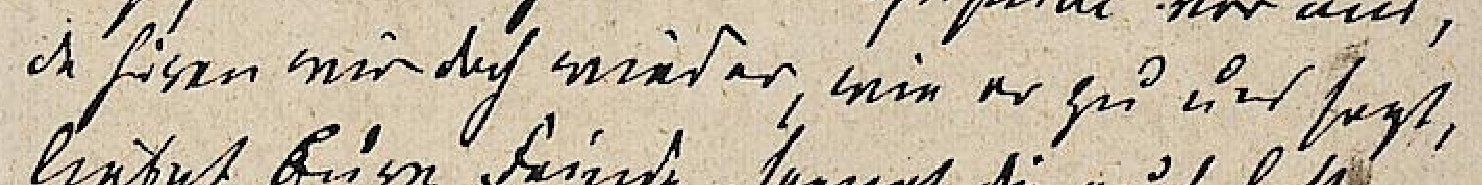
da hören wir doch wieder, wie er zu uns sagt,
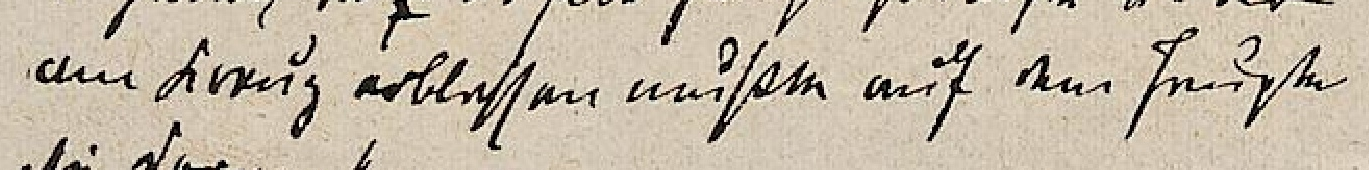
am Kreuz erblassen mußte auf dem Haupte
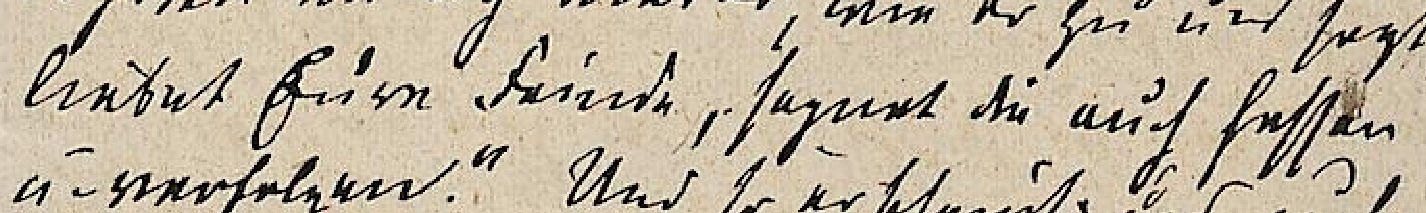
liebet Eure Feinde, segnet die auch hassen
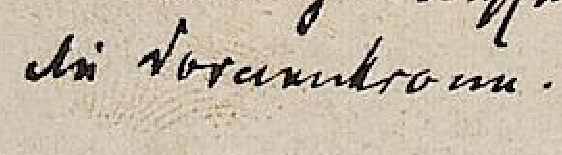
die Dornenkrone.
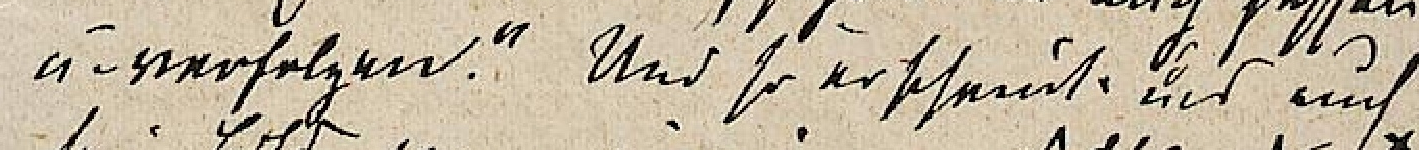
u. verfolgen." Und so erscheint uns auch
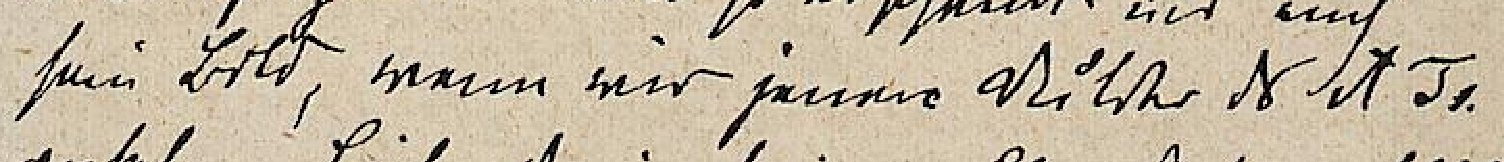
sein Bild, wenn wir jenen Dulder ds A.Ts.
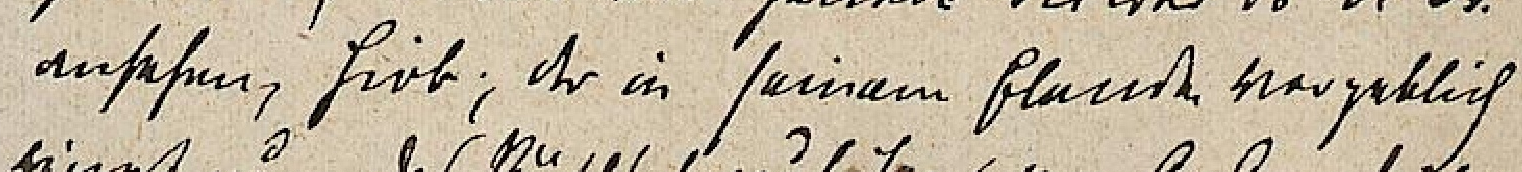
ansehen, Hiob, der in seinem Elende vergeblich
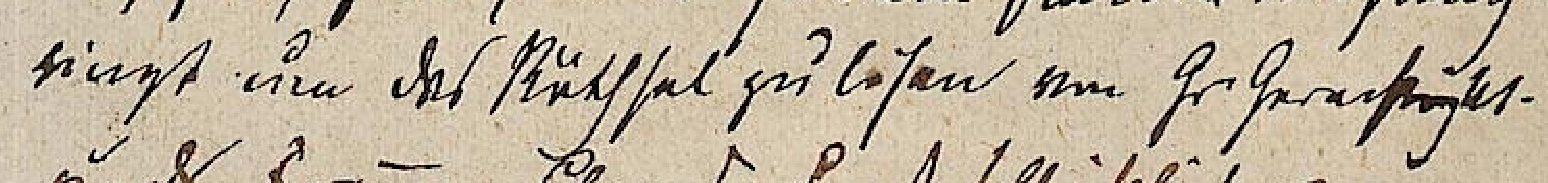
ringt um, das Rätssel zu lösen von Go. Gerechtigkt.
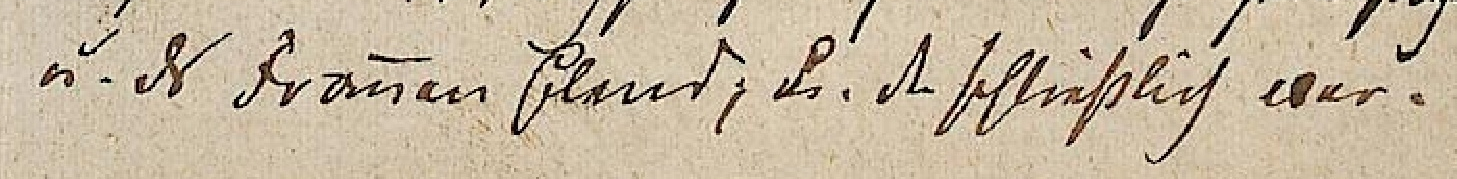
u ds Fromen Elend, u. de. schließlich ver¬
